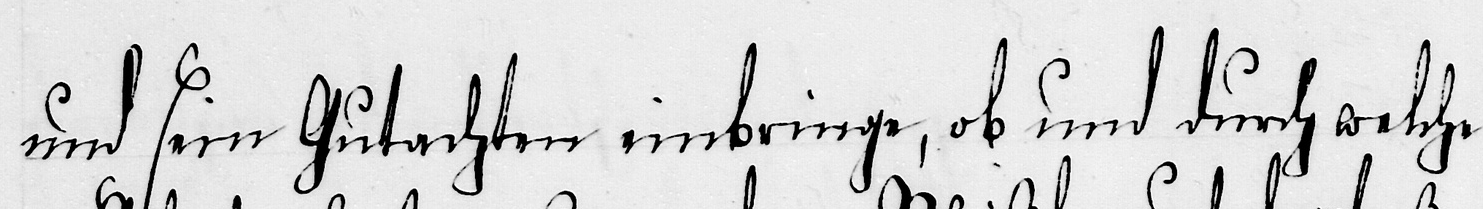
und sein Gutachten einbringe, ob und durch welche
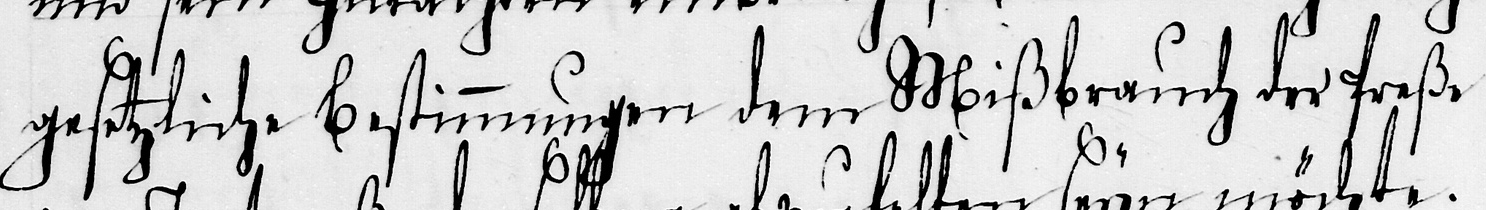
gesetzliche Bestimmungen dem Mißbrauch der Preße
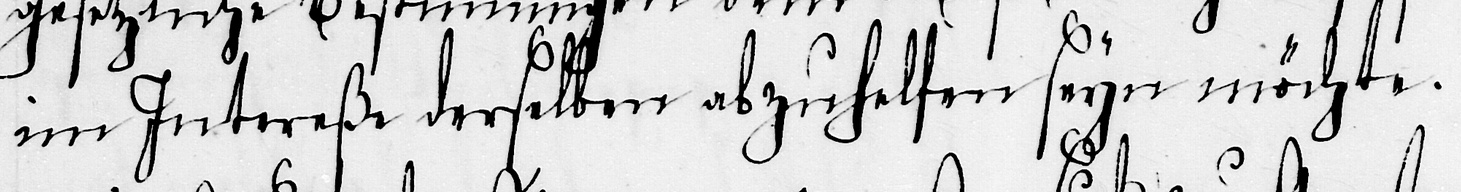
im Intereße derselben abzuhalten seyn möchte.
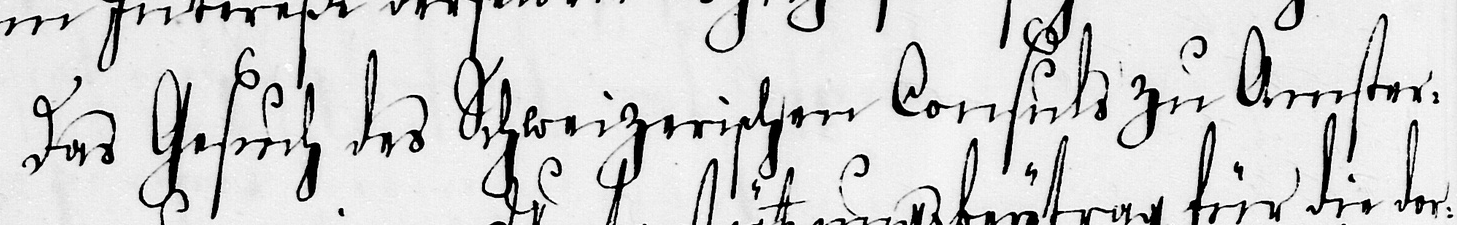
Das Gesuch des Schweizerischen Consuls zu Amster¬
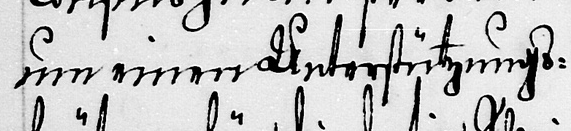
um einen Unterstützungs¬
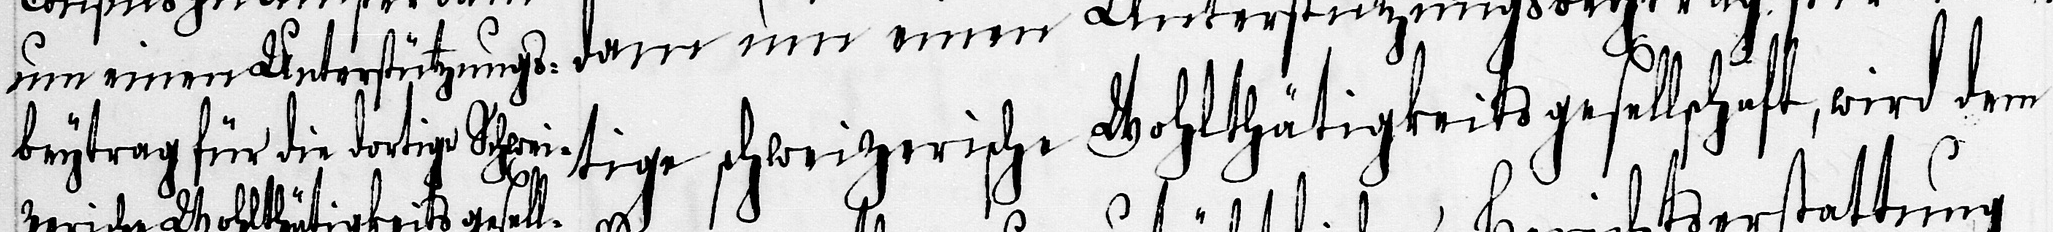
beytrag für die dortige schweizerische Wohlthätigkeitsgesellschaft, wird dem
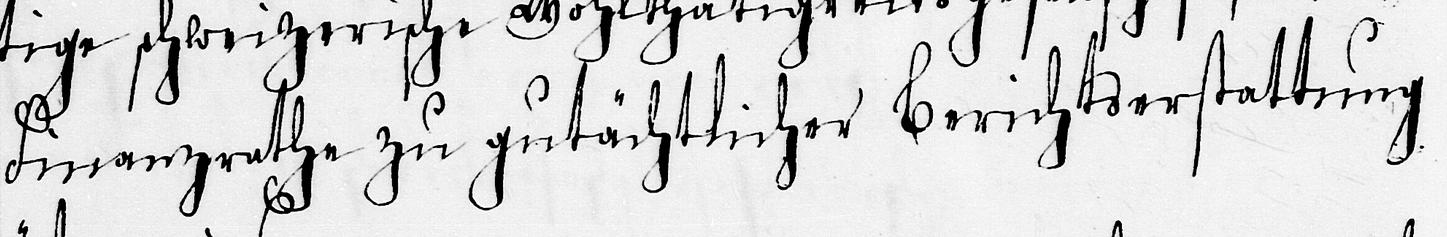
Finanzrathe zu gutächtlicher Berichterstattung
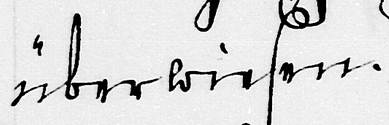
überwiesen.
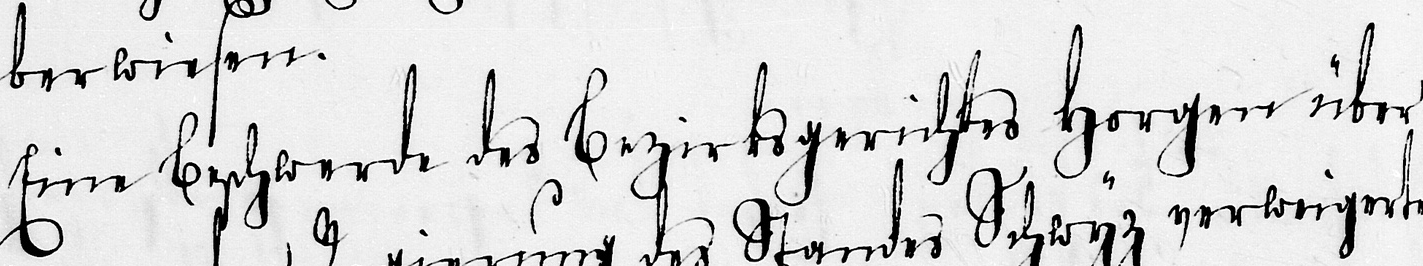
Eine Beschwerde des Bezirksgerichtes Horgen über
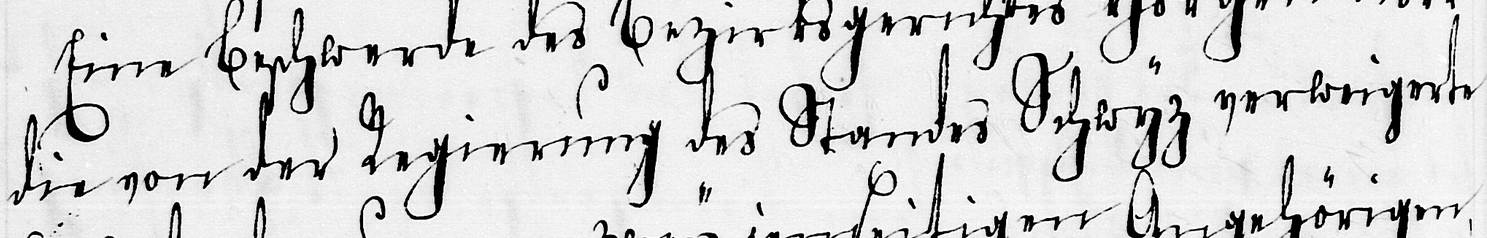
die von der Regierung des Standes Schwyz verweigerte
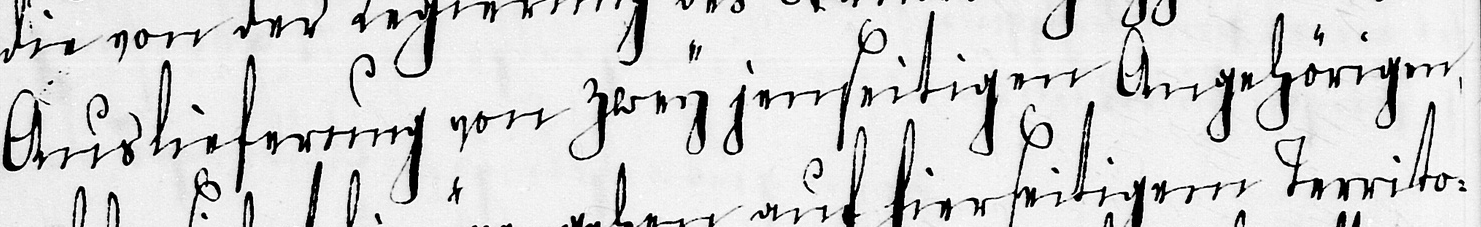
Auslieferung von zwey jenseitigen Angehörigen,
